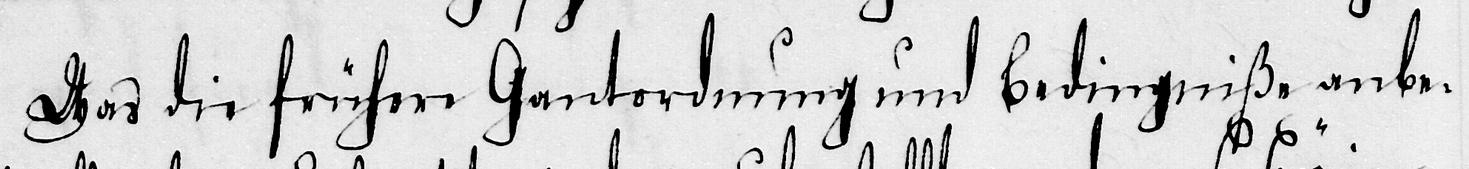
Was die frühere Gantordnung und Bedingniße anbe¬
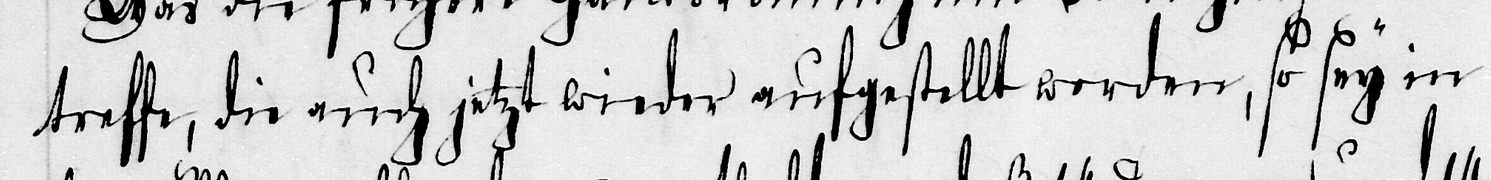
treffe, die auch jetzt wieder aufgestellt werden, so sey in
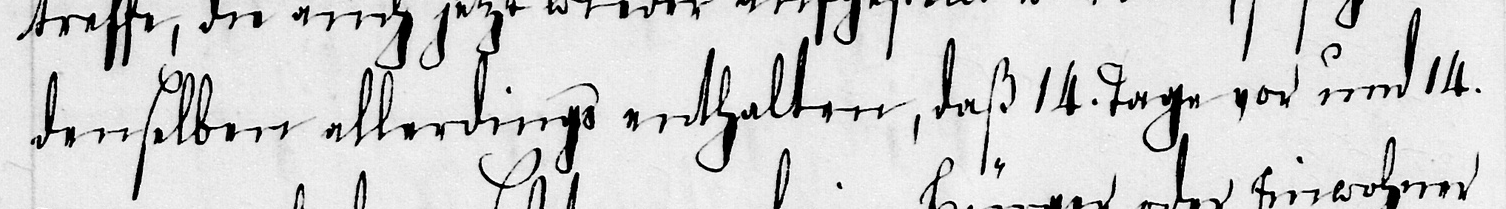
denselben allerdings enthalten, daß 14. Tage vor und 14.
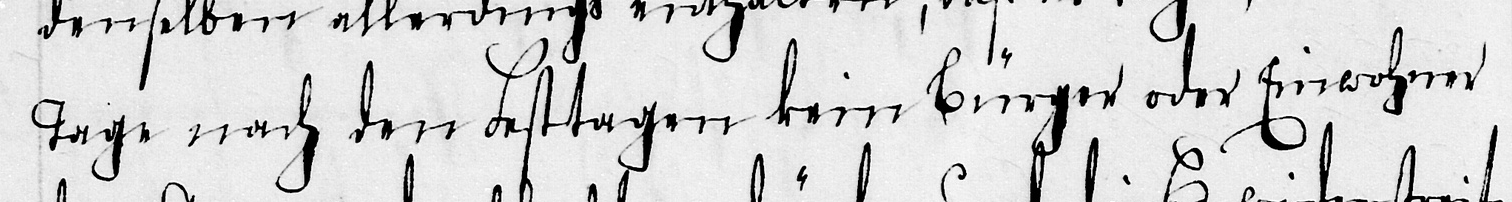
Tage nach den Festtagen kein Bürger oder Einwohner
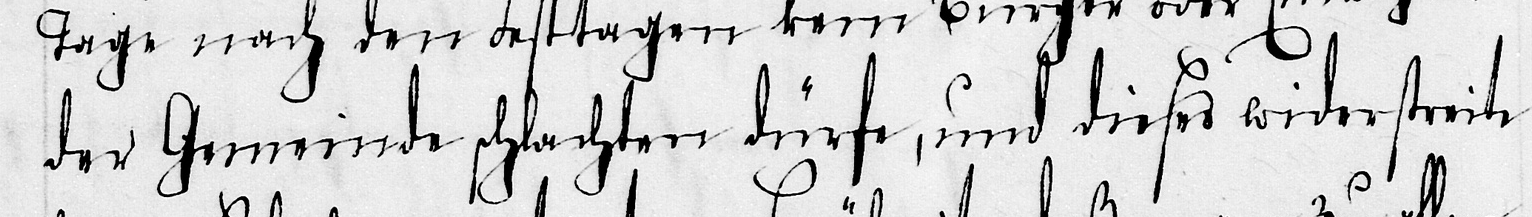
der Gemeinde schlachten dürfe, und dieses widerstreite
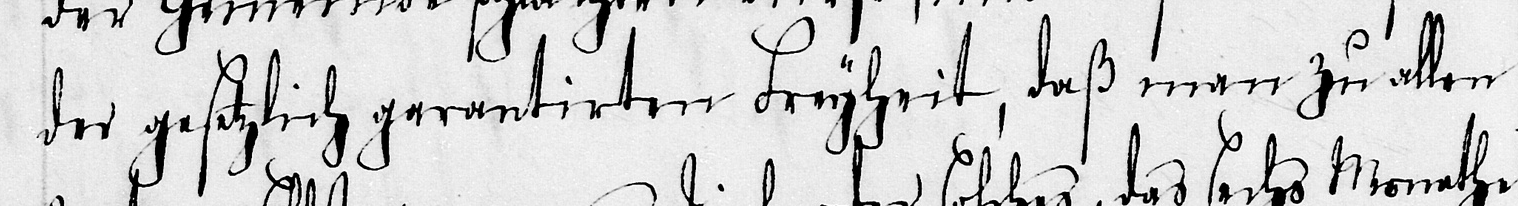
der gesetzlich garantirten Freyheit, daß man zu allen
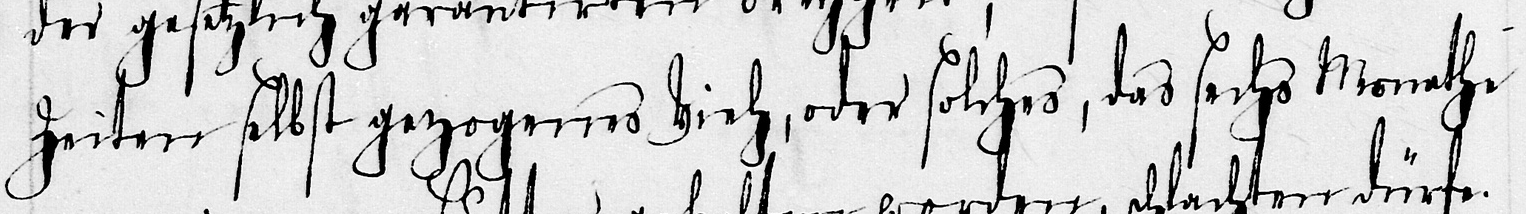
Zeiten selbst gezogenes Vieh, oder solches, das sechs Monathe
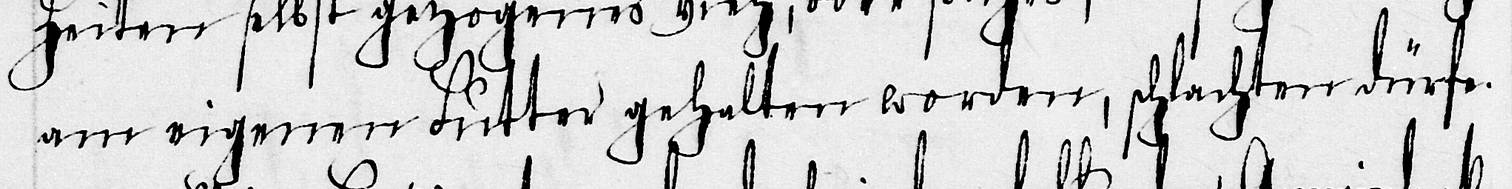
am eigenen Futter gehalten worden, schlachten dürfe.
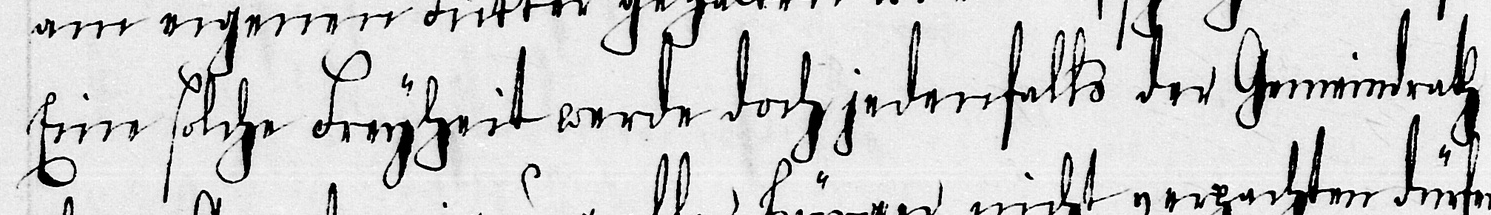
Eine solche Freyheit werde doch jedenfalls der Gemeindrath
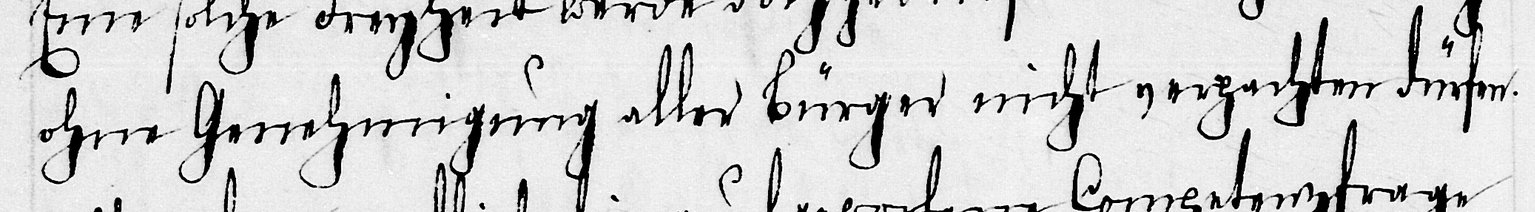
ohne Genehmigung aller Bürger nicht verpachten dürfen.
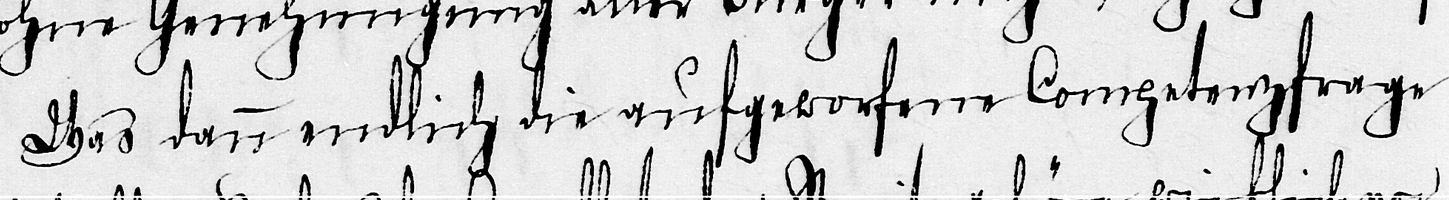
Was dann endlich die aufgeworfene Competenzfrage
